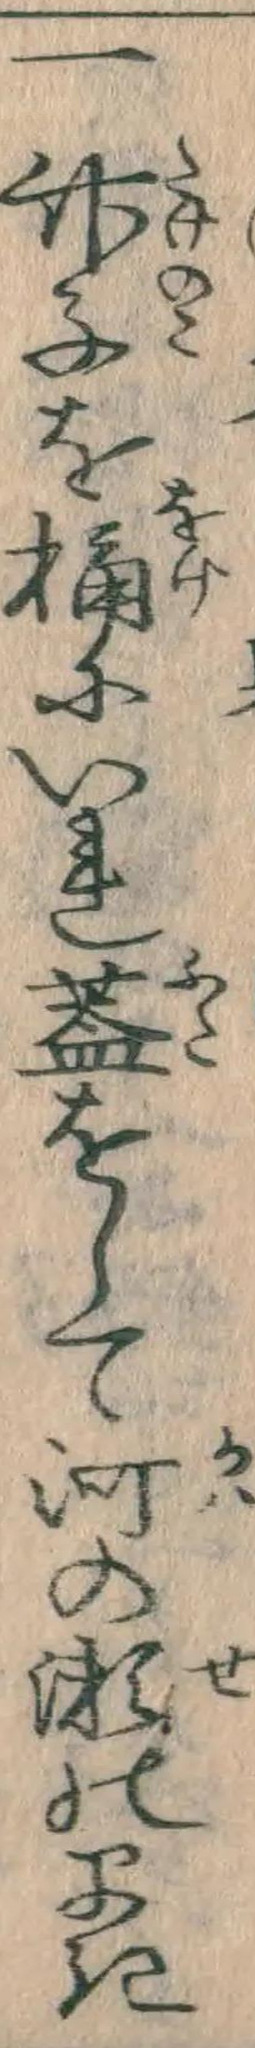一竹子を桶にいれ蓋をして河の瀬の早き
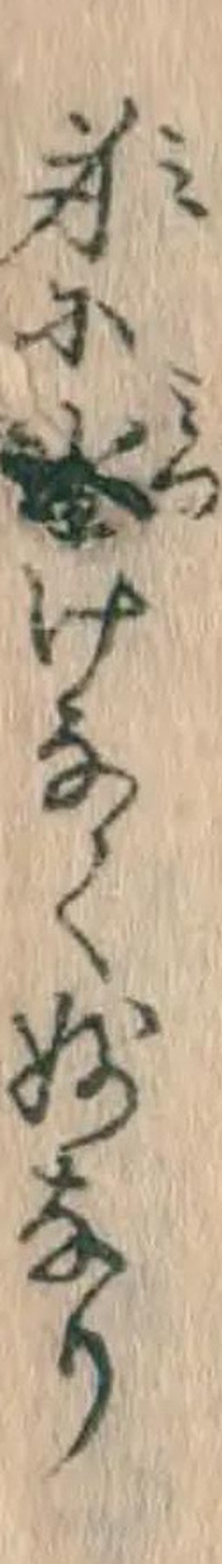身に水けなく妙なり
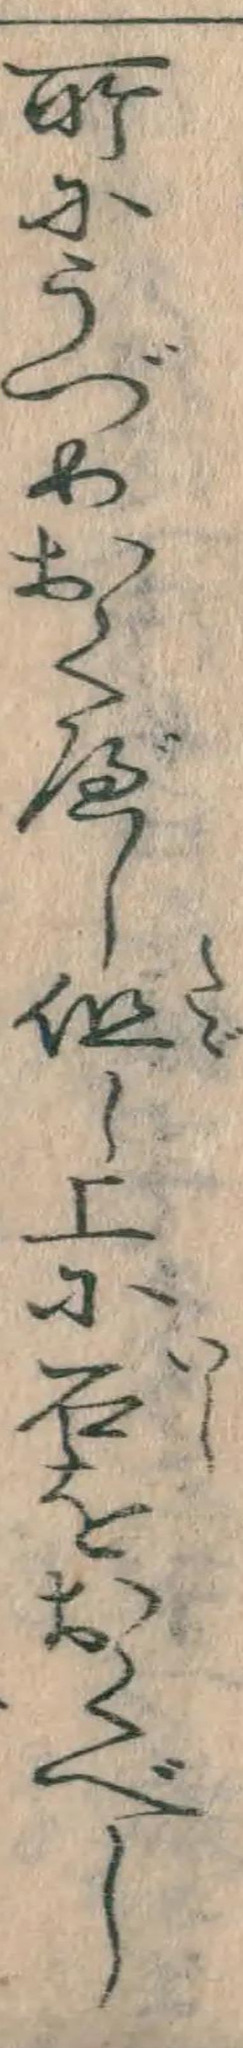所にうづめおくべし但し上に石をおくべし
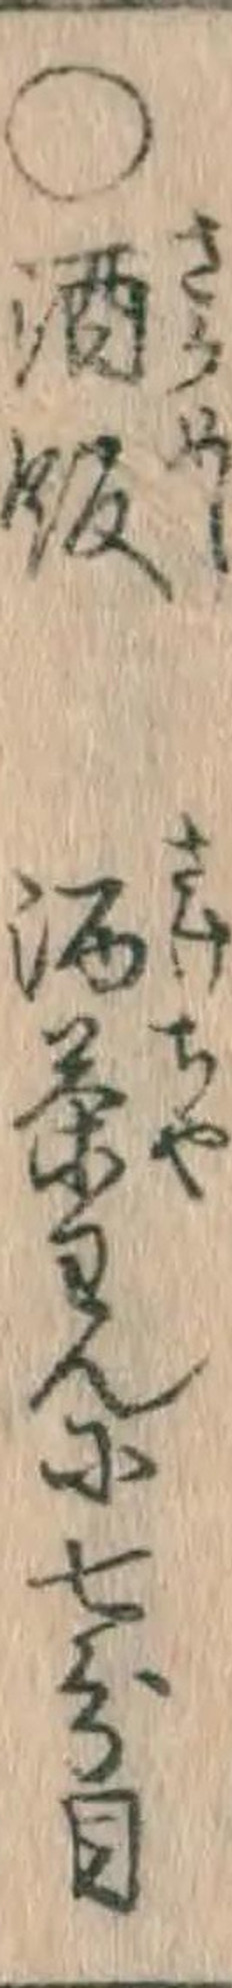○酒飯酒茶わんに七分目
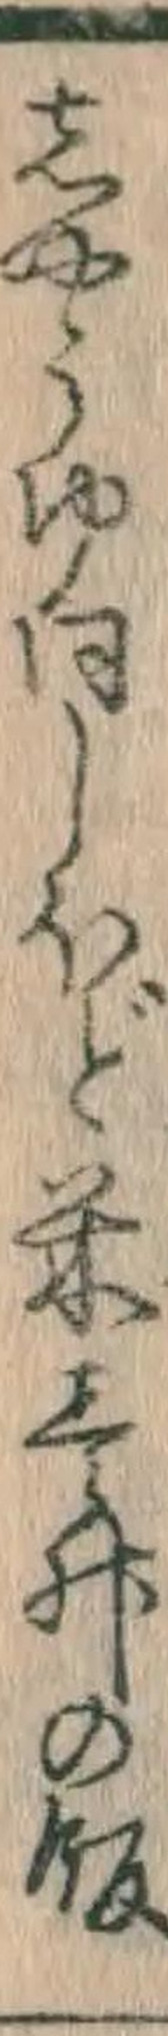しやうゆ同しほど米壱升の飯
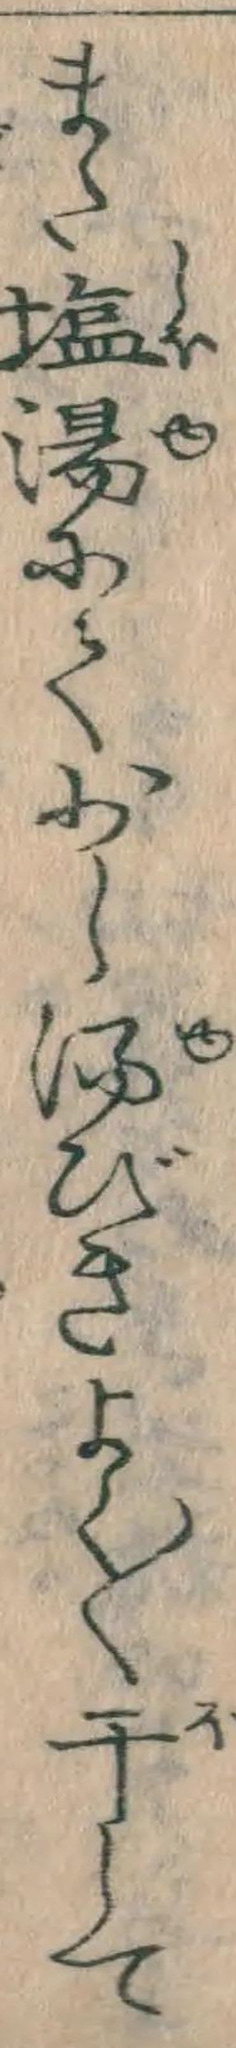また塩湯にて少し湯びきよく〳〵干して
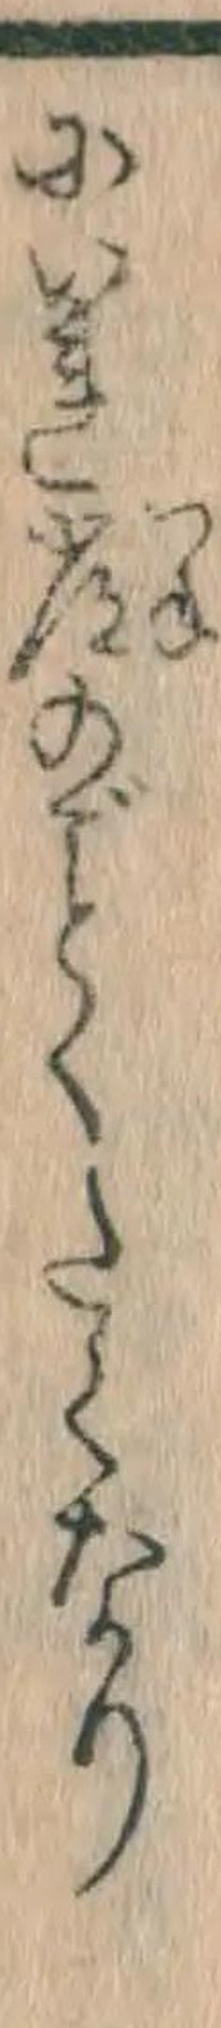にいれ常のごとくたくなり
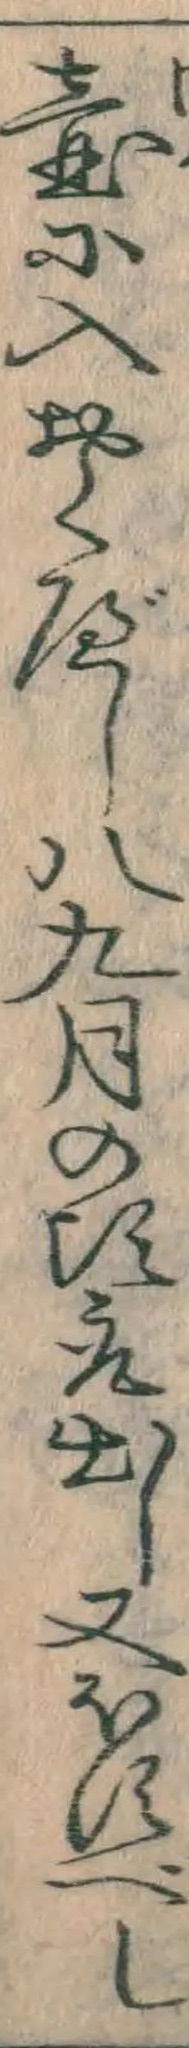壺に入おくべし八九月の頃取出し又ほすべし

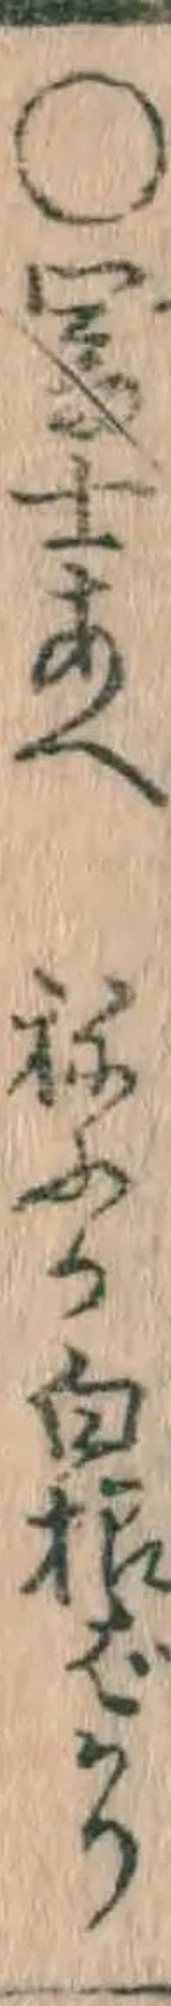○富士あへねふか白根ばかり
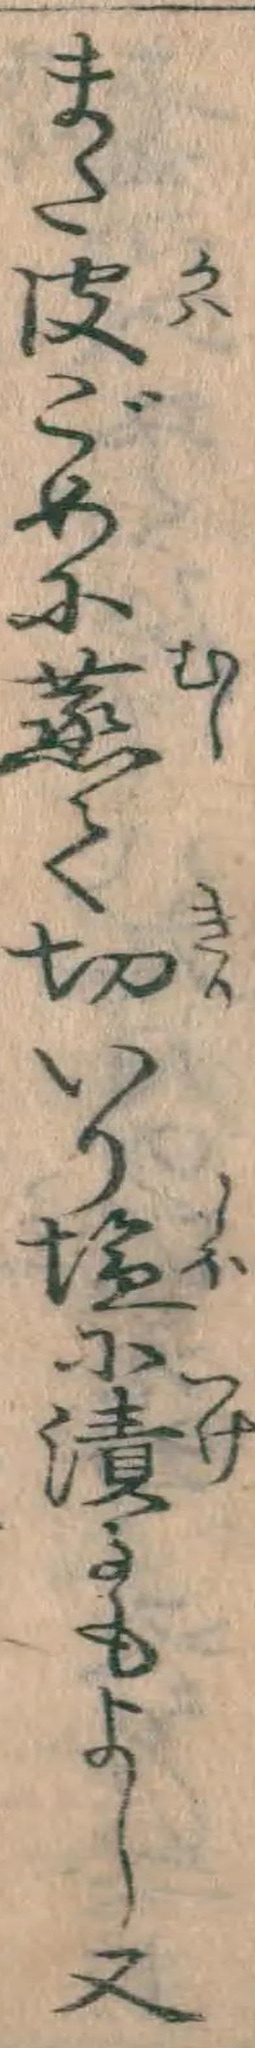また皮ごめに蒸て切いり塩に漬るもよし又
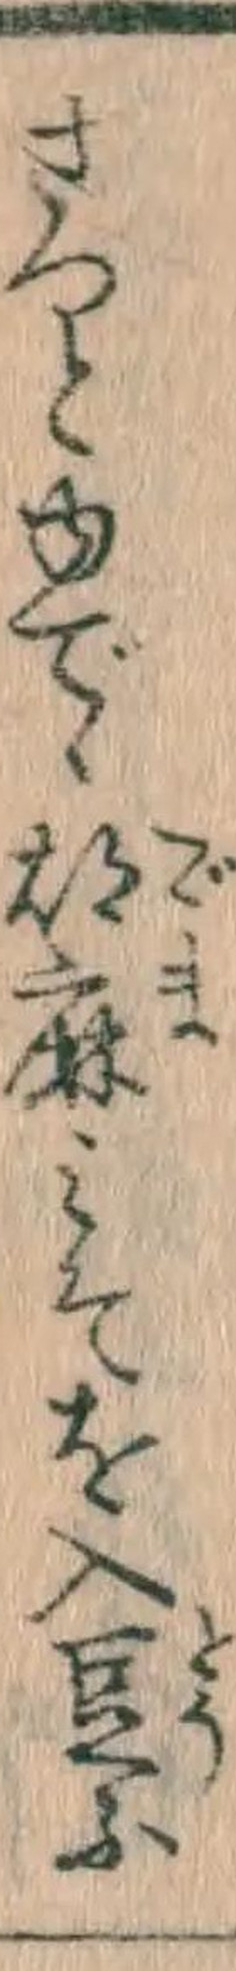さつとゆでゝ胡麻みそを入豆ふ
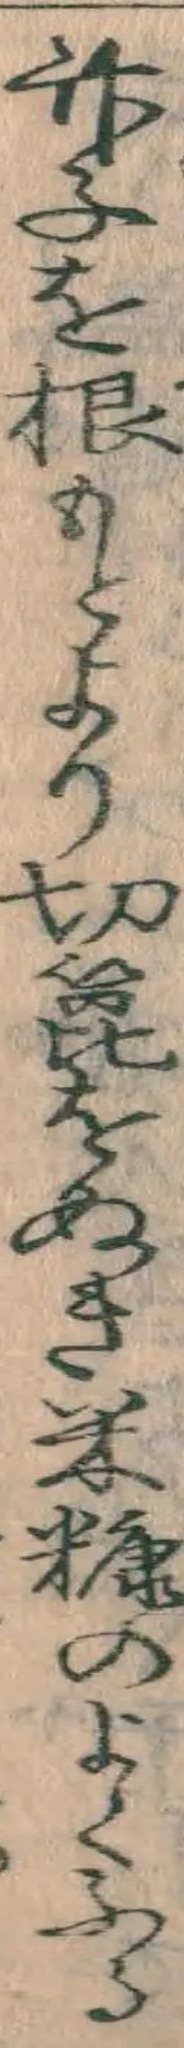竹子を根もとより切箆をぬき米糠のよくふる
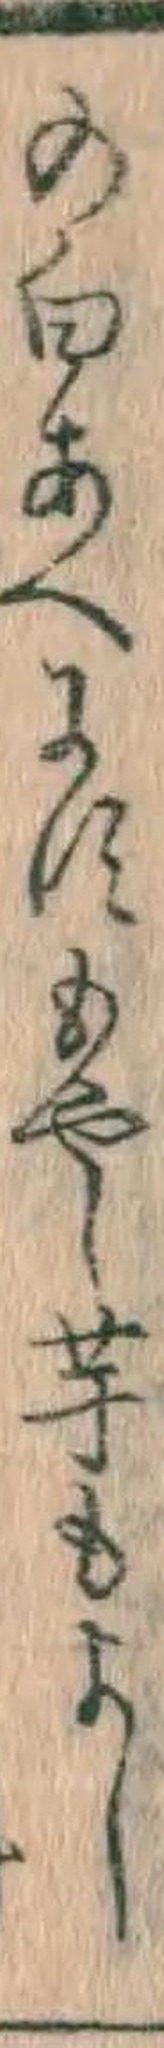の白あへにすもやし芋もよし
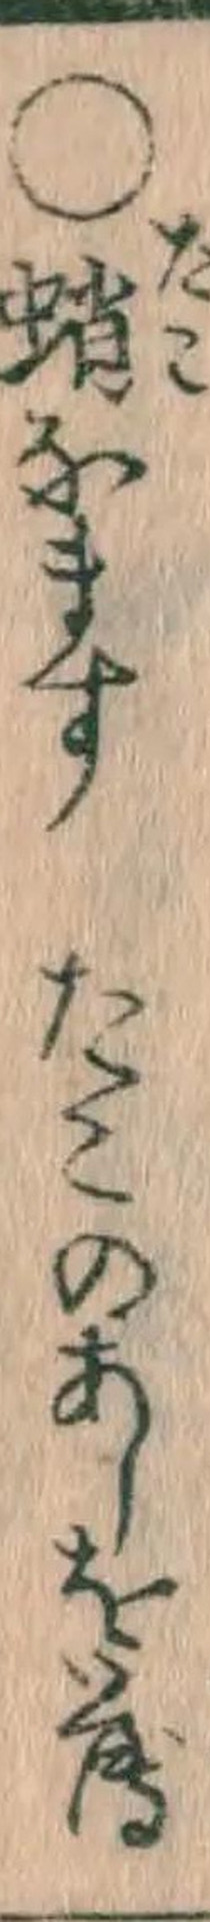○蛸なますたこのあしを薄
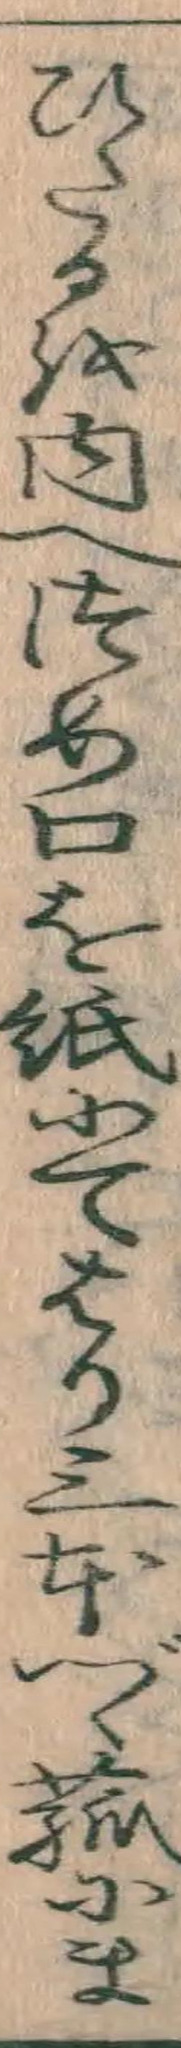ひたるを内へつめ口を紙にてはり三本づゝ菰にま
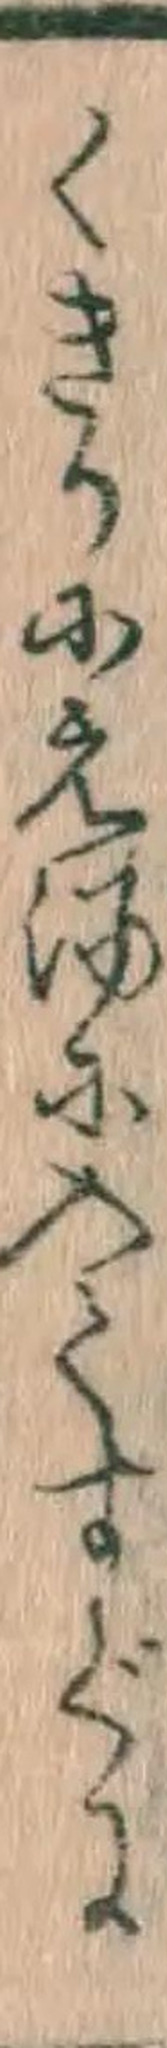くきりにえ湯に入てすぐに
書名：広益秘事大全 3巻. [5]
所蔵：国立国会図書館 National Diet Library, JAPAN
